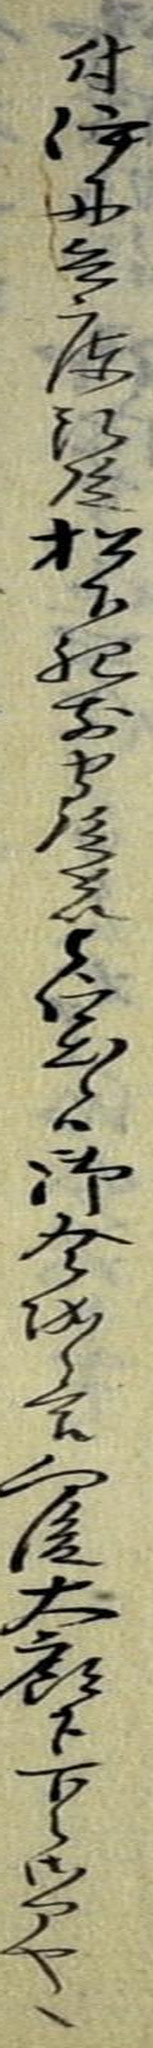付伊丹兵庫頭殿松下肥前守殿を以被仰出候は御登城之節向後大廊下下之御部屋へ
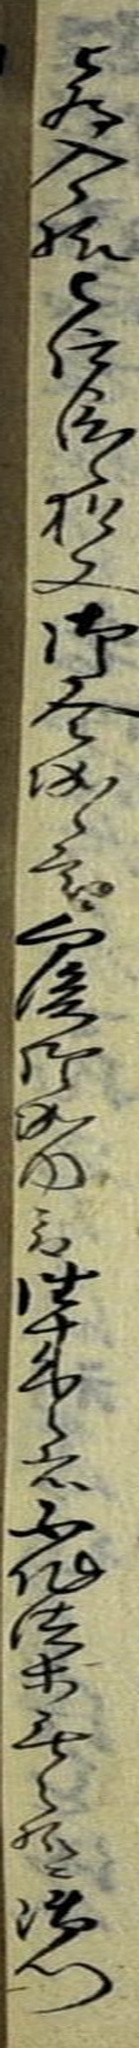被為入候様被仰渡候猶又御登城之節向後御城内に而往来之者不作法等無之様に御門
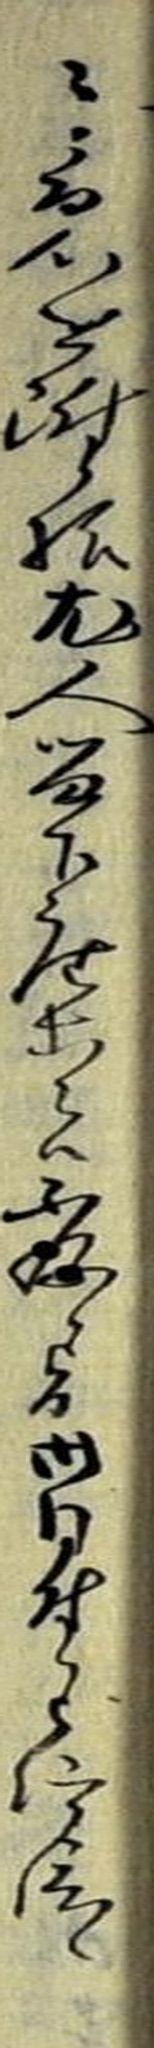々に而心を附候様尤人留下座等には不及候旨御目付へ被仰渡候
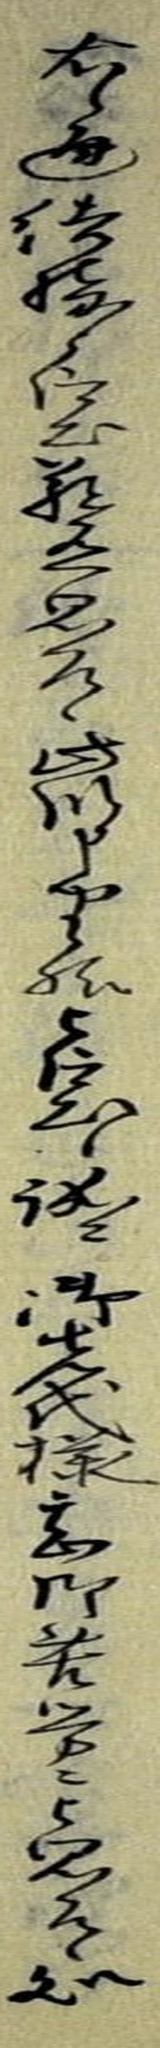右之通結構被仰出難有思召候此段申聞候様被仰出候誠に御先代様甚御苦労に被思召候処
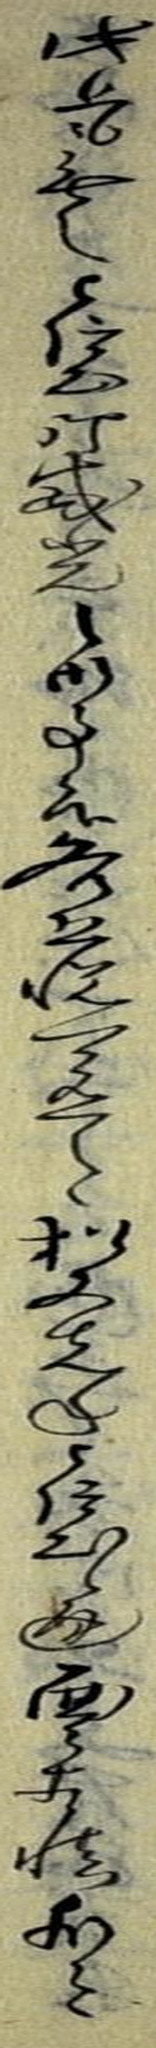此上も無之被仰出御威光之御事に候各恐悦可有之候猶又先年被仰出候通面々相慎外々へ
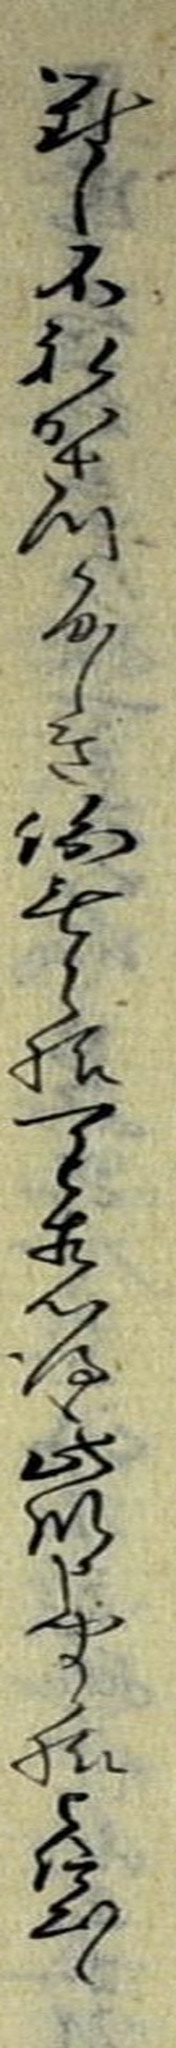対し不礼かさつかましき儀無之様可被相心得候此段申聞候様被仰出候
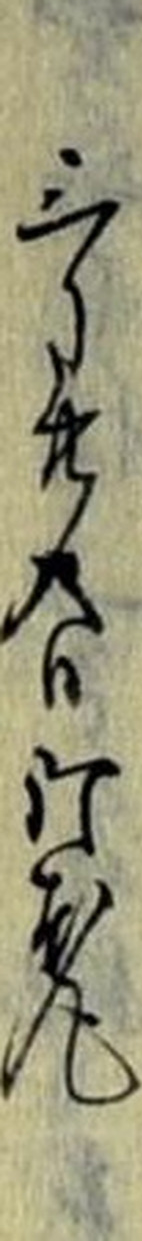三月廿九日御本丸
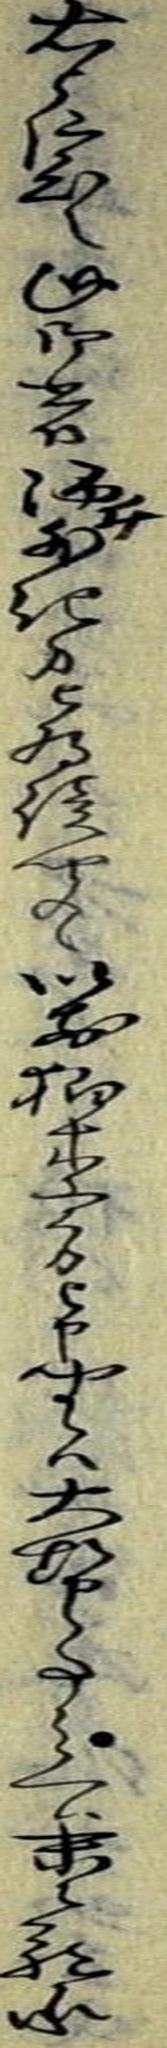右被仰出之趣御書付酒井外記方被為続聞候以前狛杢方被申聞候は大勢之事に候へは末々難承
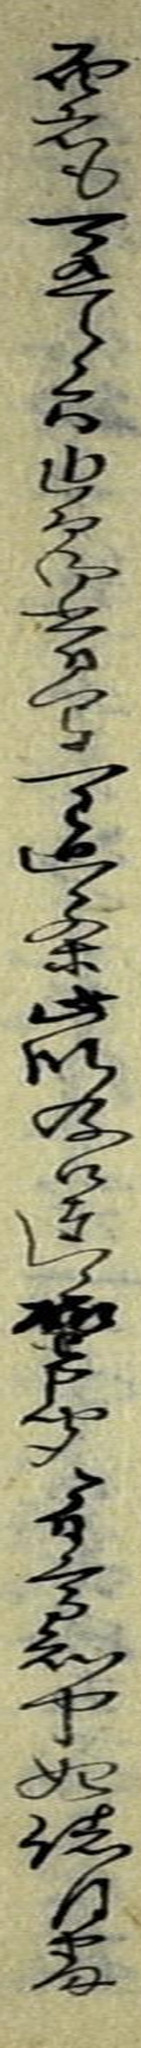届者も可有之候間追而御書付写可被廻条此段及口達候様被申聞候に付高知中始諸月番
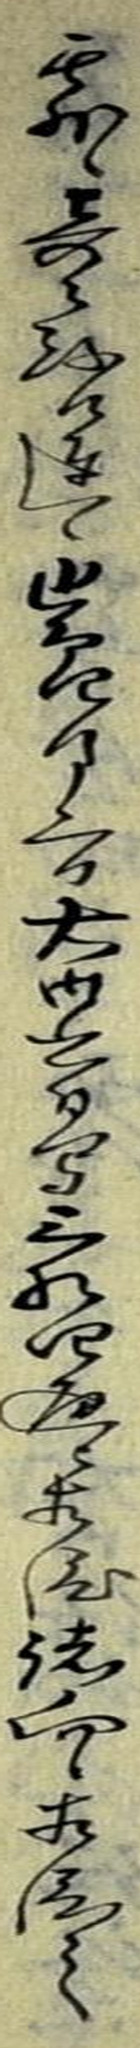其外へ寄々致口達候追而四月二日右御書付写三拾四通被相渡諸向に相渡之
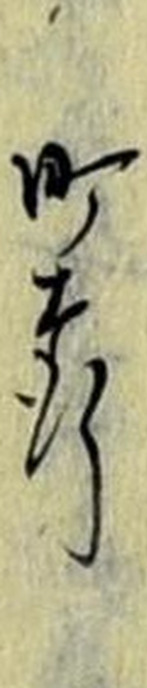町奉行
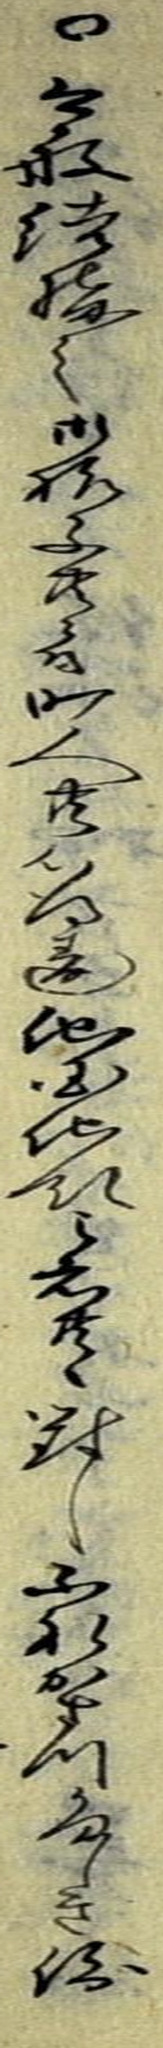〇今般結構之御様子共に付町人共心得違他国他領之者共へ対し不礼かさつかましき儀
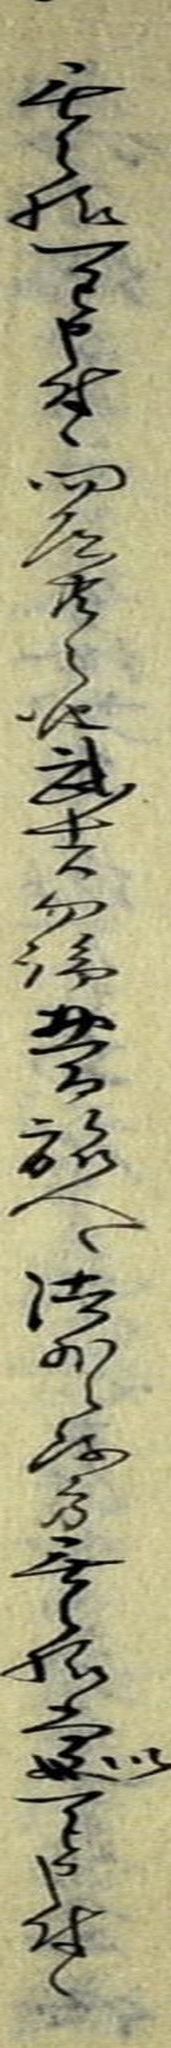無之様可被申付候問屋共之儀武士は勿論惣而旅人へ法外之致方無之様尚以可被申付候
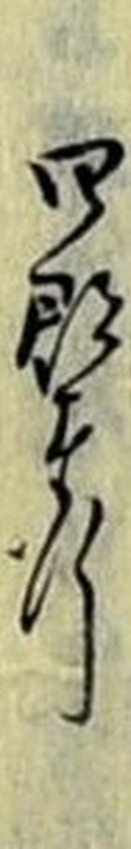四郡奉行
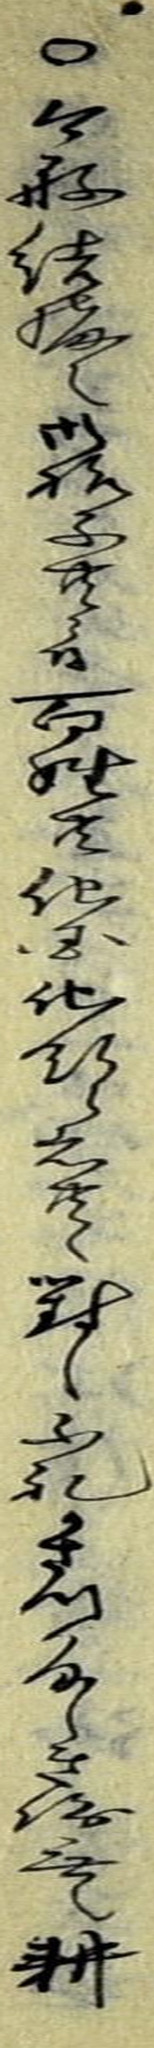〇今般結構之御様子共に付百姓共他国他領之者共へ対し不礼かさつかましき儀無之耕
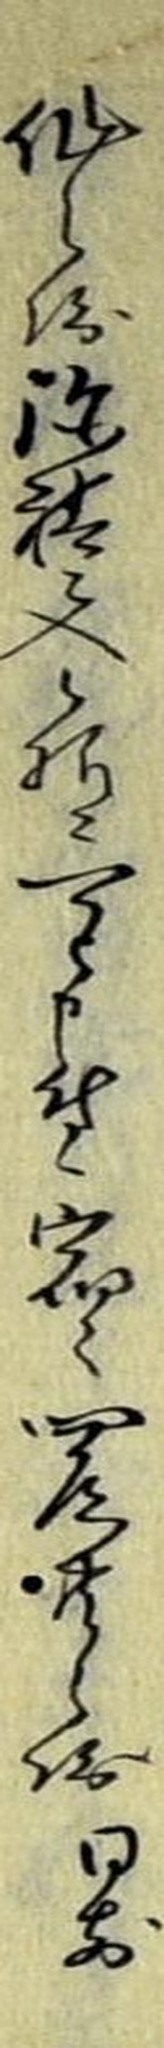作之儀弥精に入候様に可被申付候宿々問屋共之儀同前
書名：命令之部 二
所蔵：福井県文書館 Fukui Prefectural Archives
